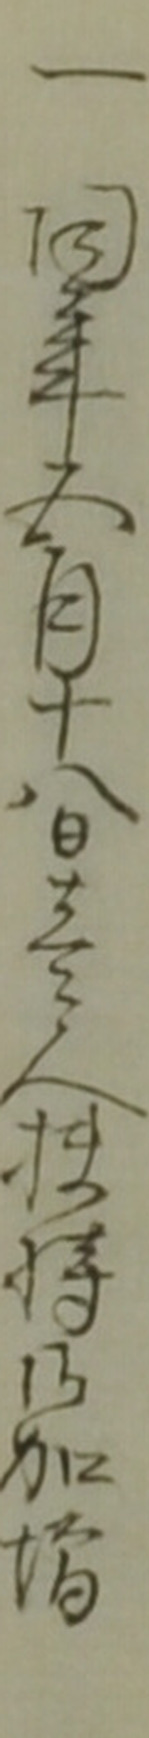一同年五月十八日壱人扶持御加増
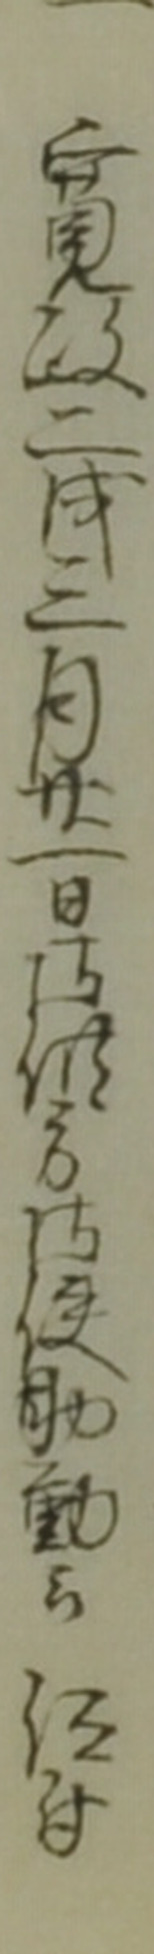一寛政二戌三月廿一日御供方御使助勤被仰付
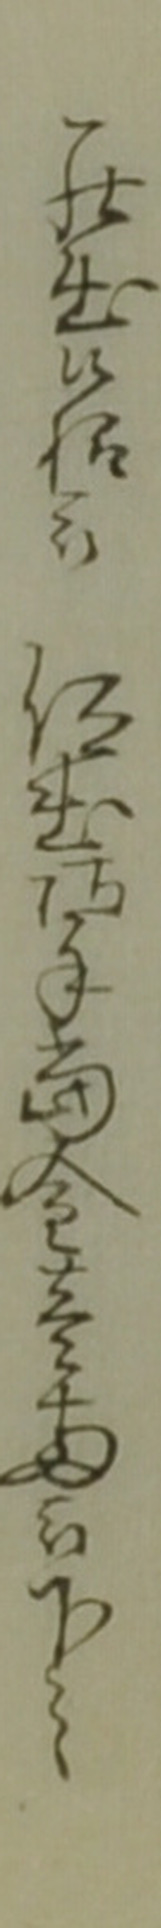罷出候様被仰出御手当金壱両被下之
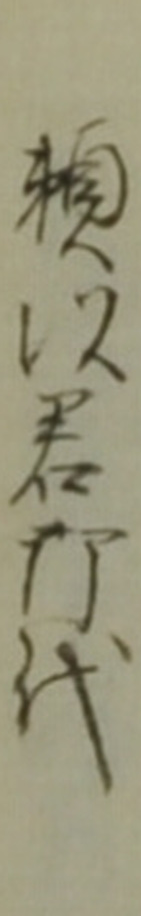頼以君御代
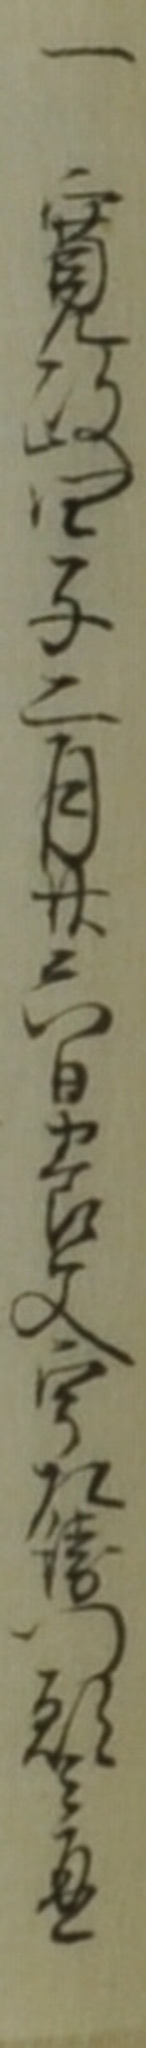一寛政四子二月廿六日養父宇左衛門願之通
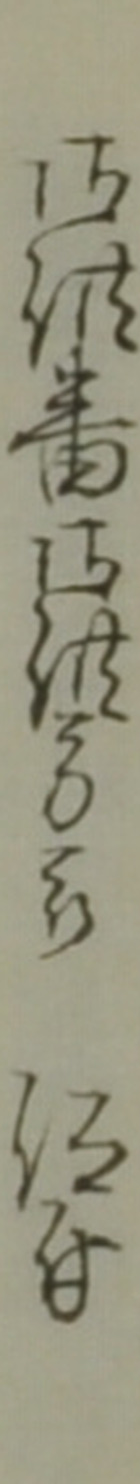御供番御供方被仰付
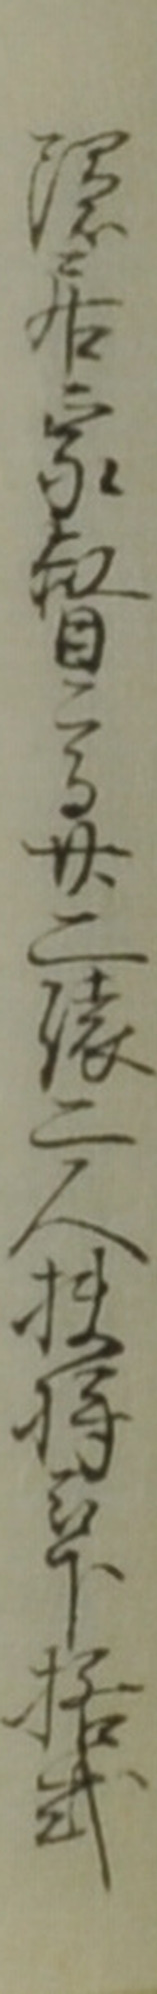隠居家督高廿二俵二人扶持被下格式
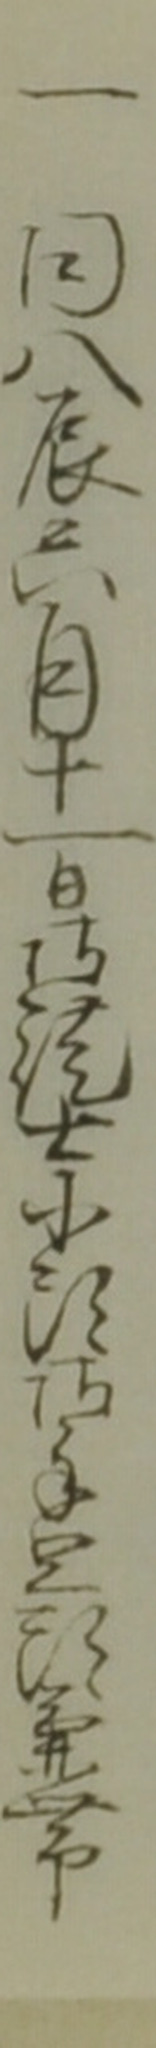一同八辰六月十一日御徒士小頭御手廻頭兼帯
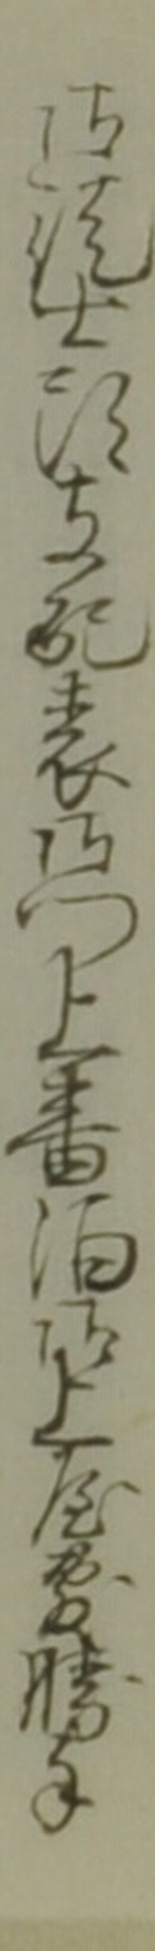御徒士頭支配表御門上番泊御上屋敷勝手
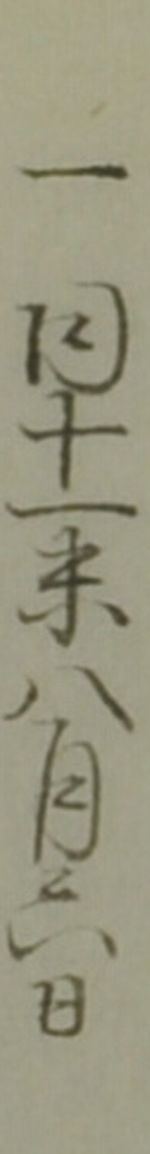一同十一日未八月六日
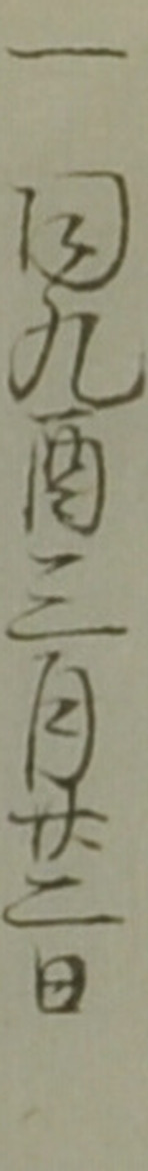一同九酉三月廿二日
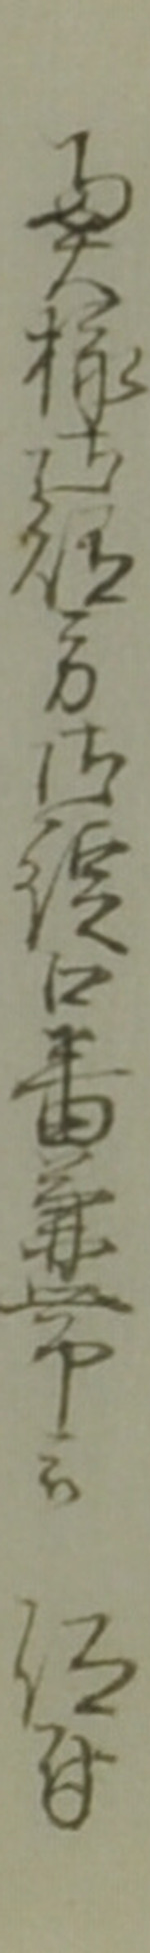奥様御賄方御錠口番兼帯被仰付
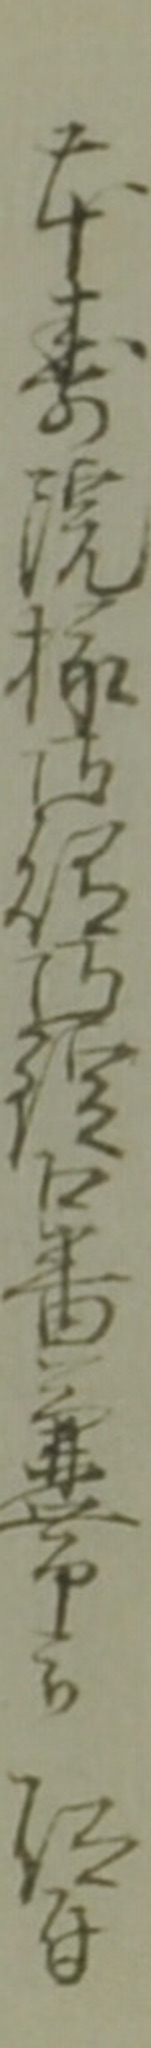本寿院様御賄御錠口番兼帯被仰付
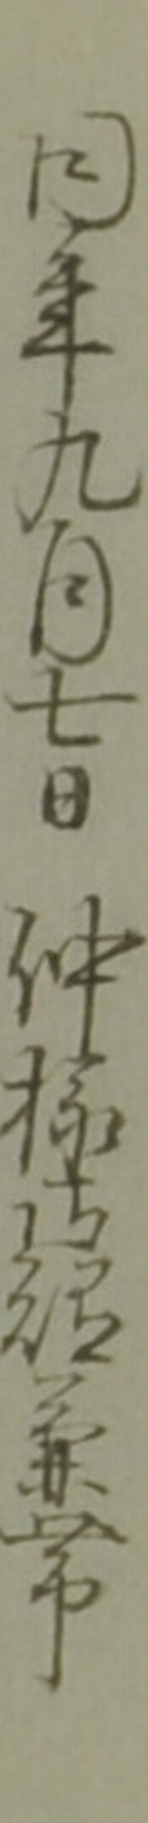一同年九月七日仲様御賄兼帯
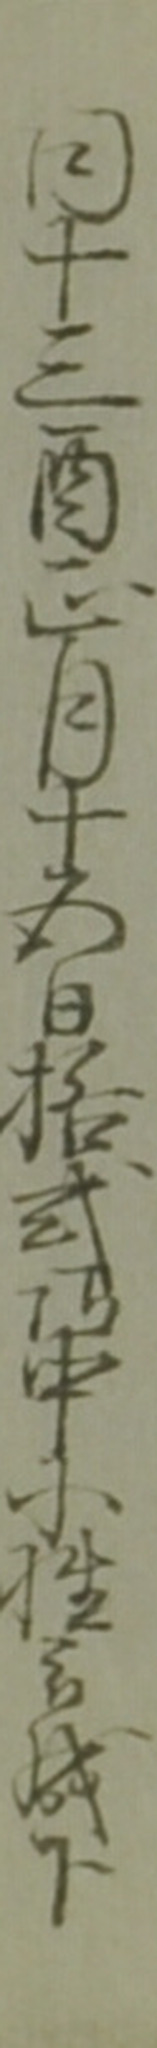一同十三酉正月十五日格式御中小性被成下
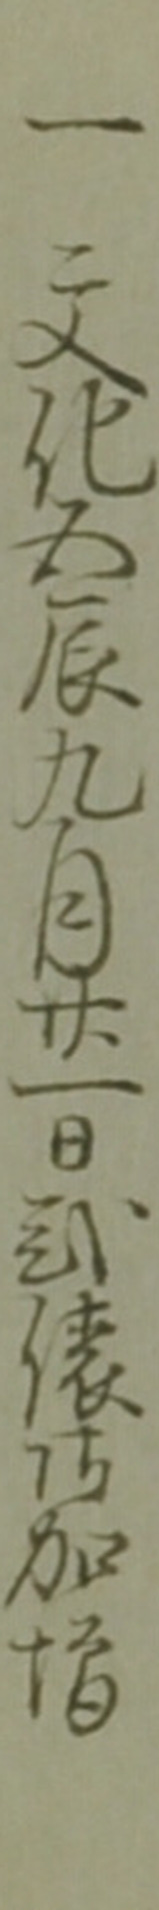一文化五辰九月廿一日弐俵御加増
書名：無足諸士勤仕録（一）
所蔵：伊那市立高遠町図書館・合同会社AMANE
